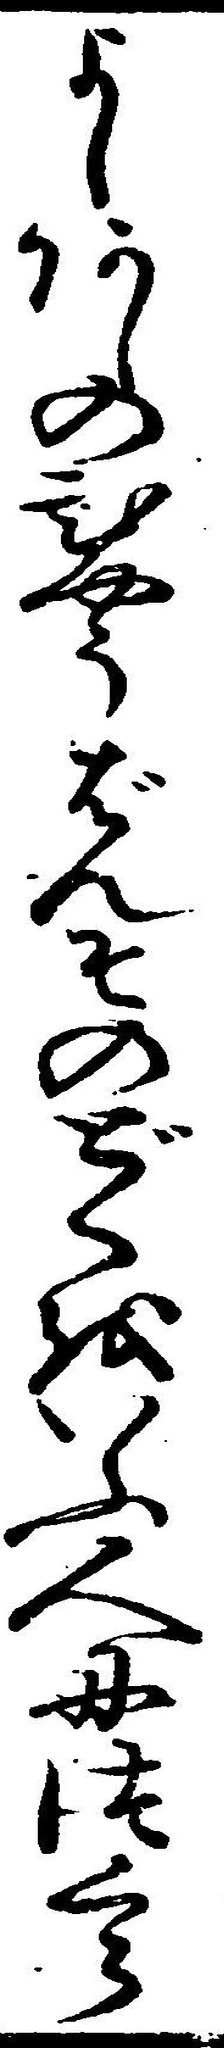よしあしのひやうばんそのどくをいふ人につくら
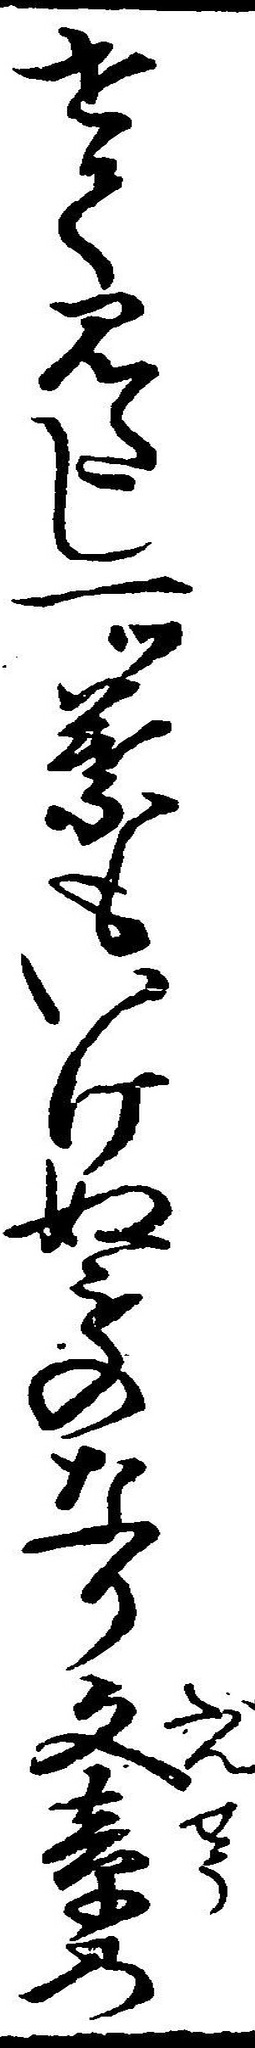さして見たし一ッ葉もいけぬものなり文章の
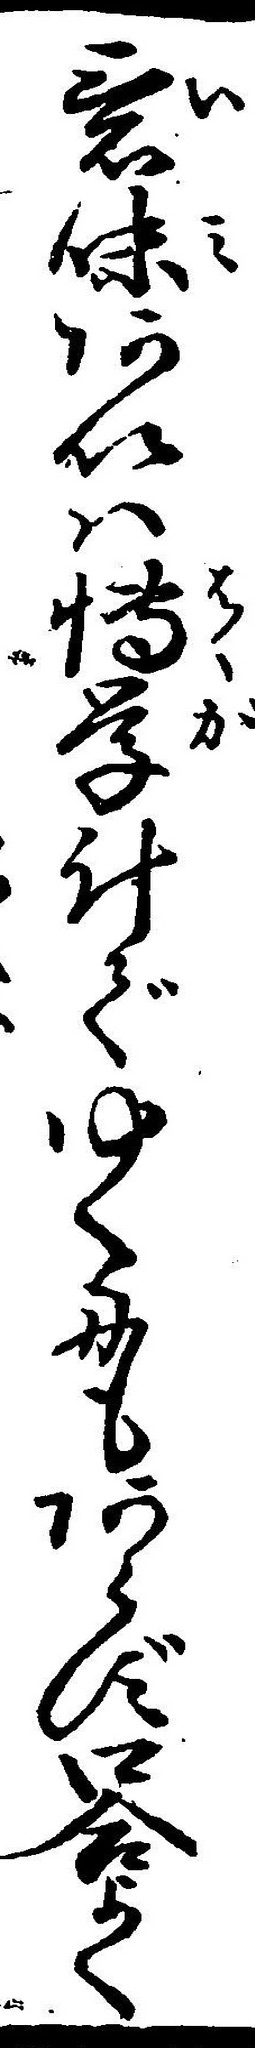意味あいは博学計でゆくにもあらず口合よく
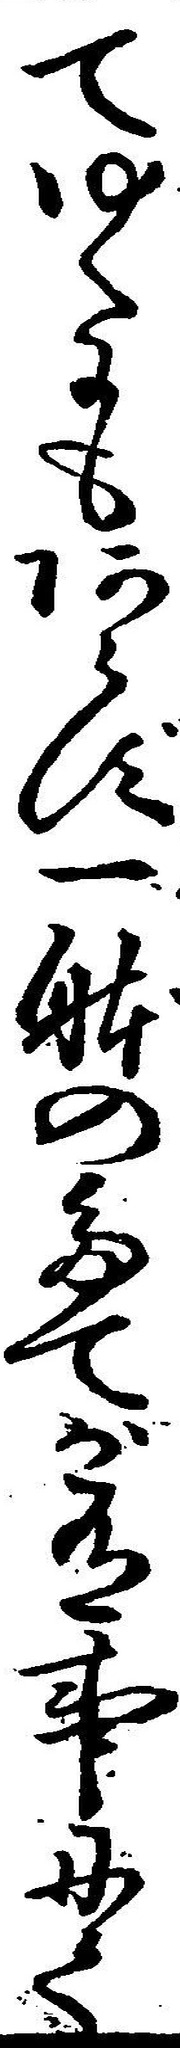てゆくにもあらず一体のたてが有事にて
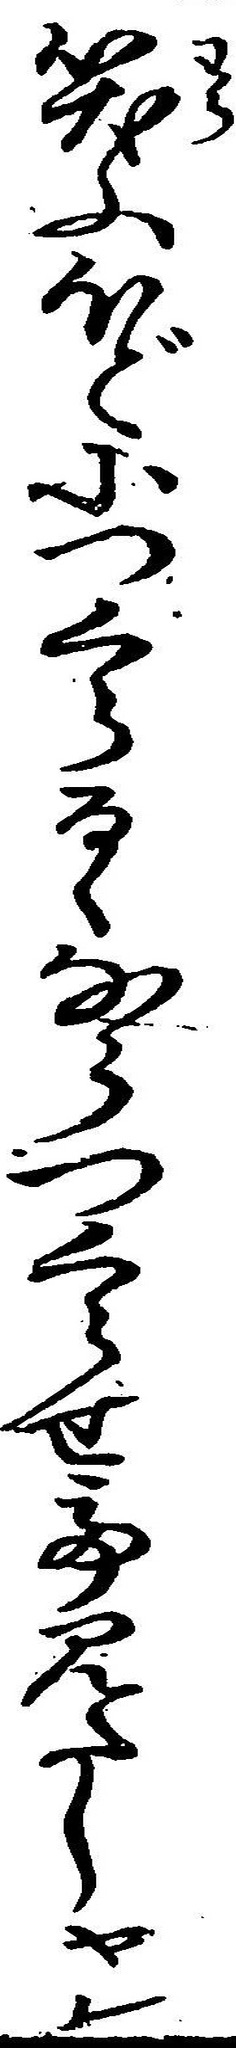笑ふほどにつくらるゝならつくらせて見たしヤレ
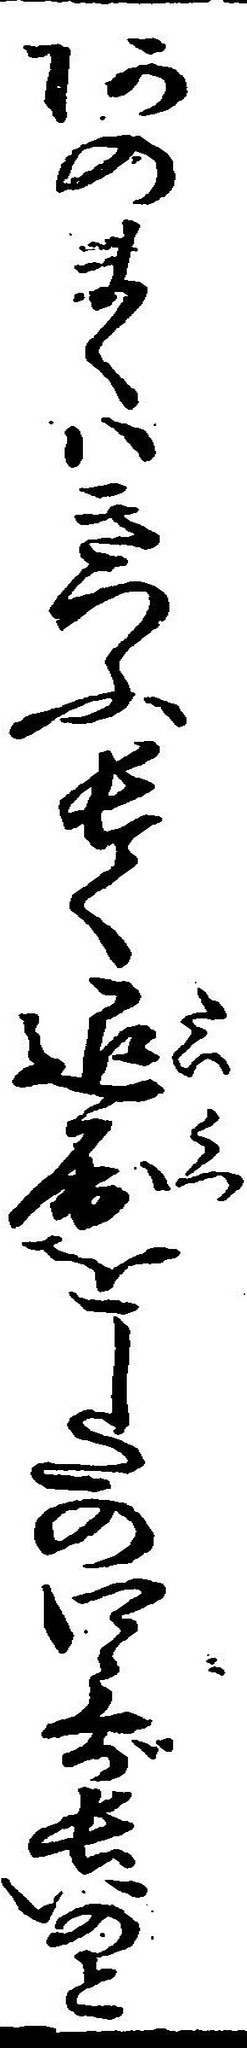あのまゝはきつふ長く退屈をしたの口上が長いのと
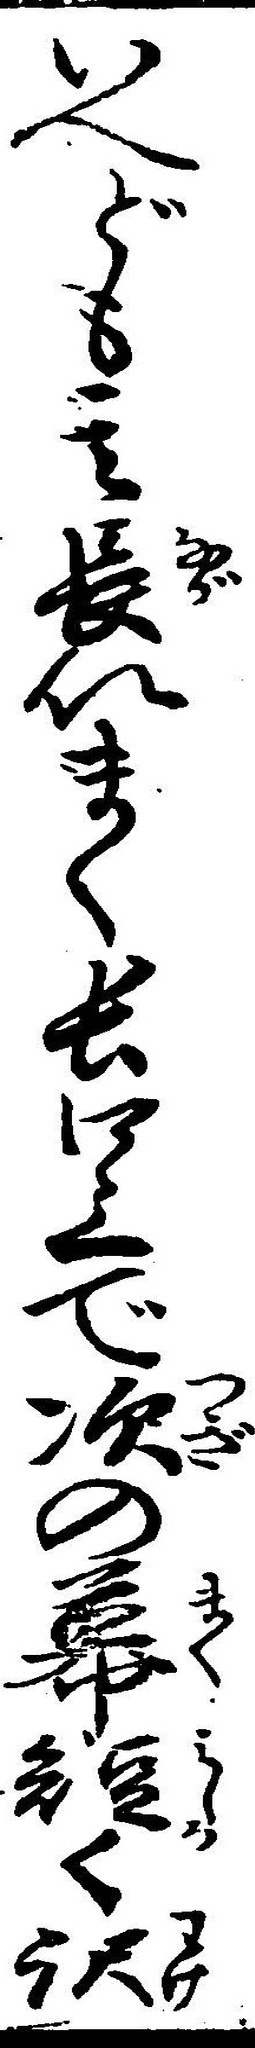いへども其長いまゝ長口上で次の幕短く訳
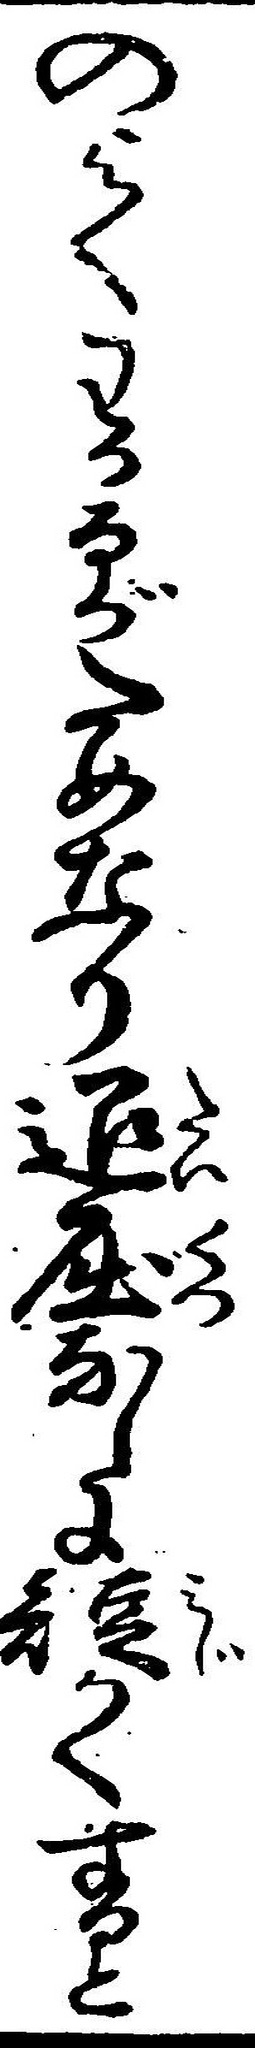のよくわかるがためなり退屈なしに短かくすると
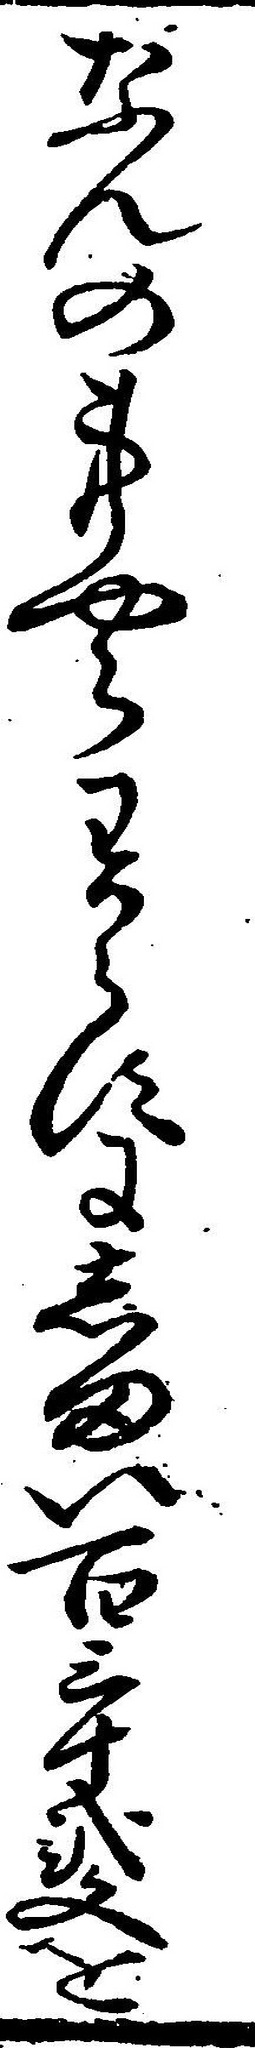なんの事やらわからすにしまい百三十弐文を

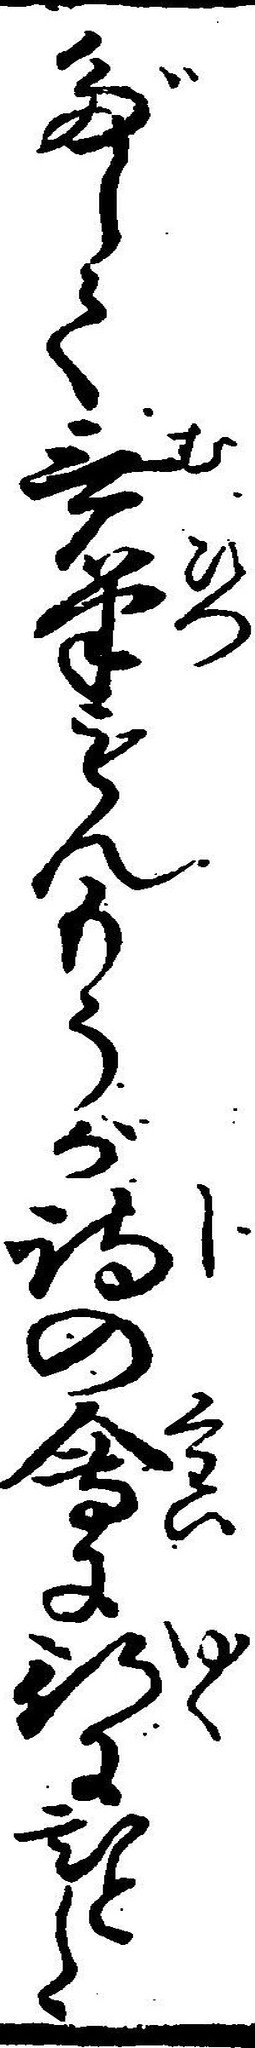だして無筆もんもうが詩の会に行にひとしく
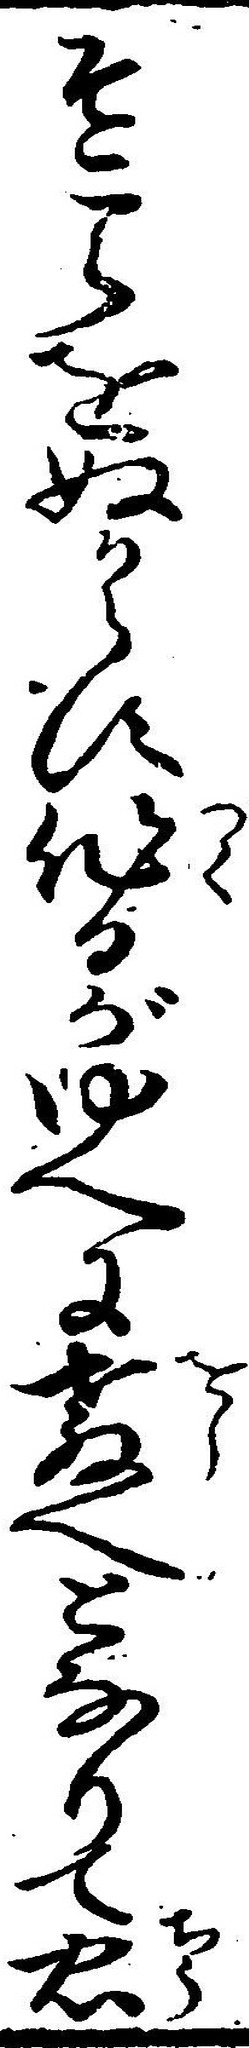そこらをぬからす作るがゆへに教へとなりて忠
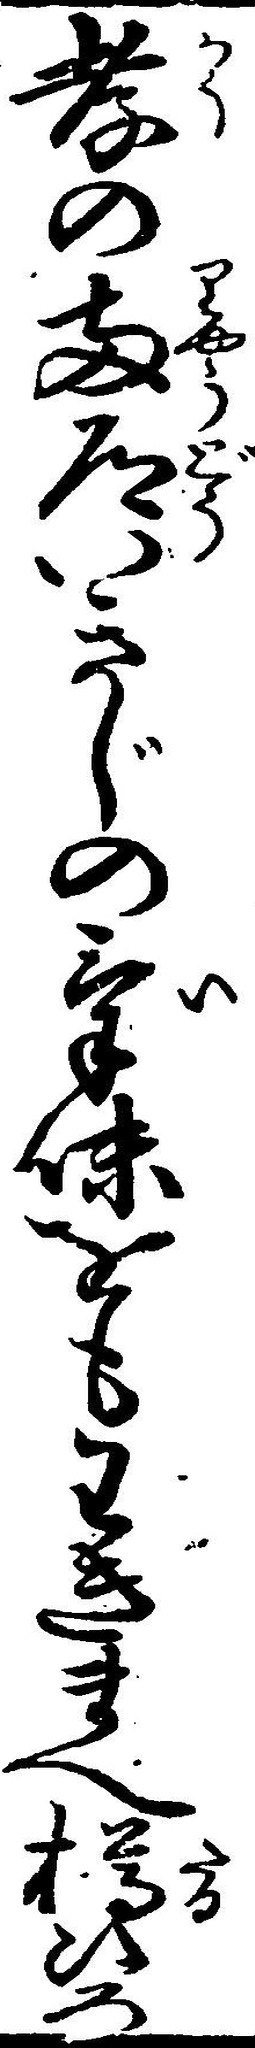孝の両道いきじの意味をもわきまへ樽ひろ
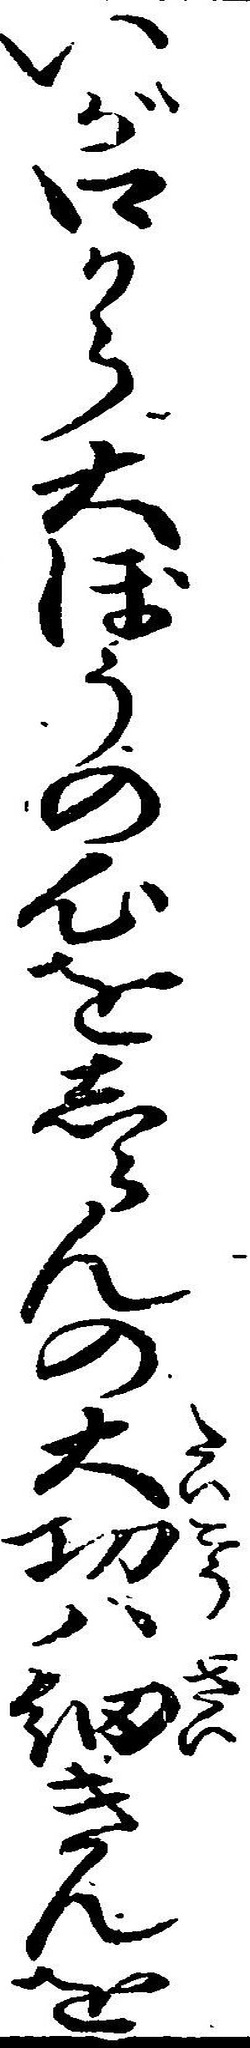いが口から大ぼうの心をしらんの大功は細きんを
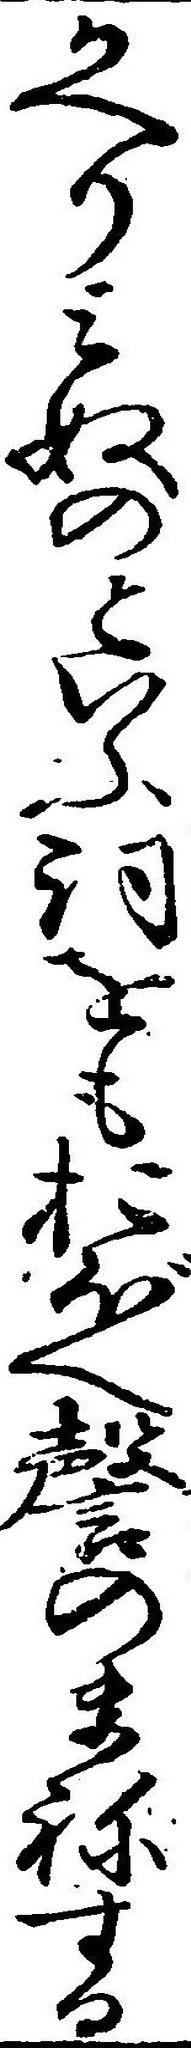かへりみぬのといふ詞をもおぼへ声のまねする
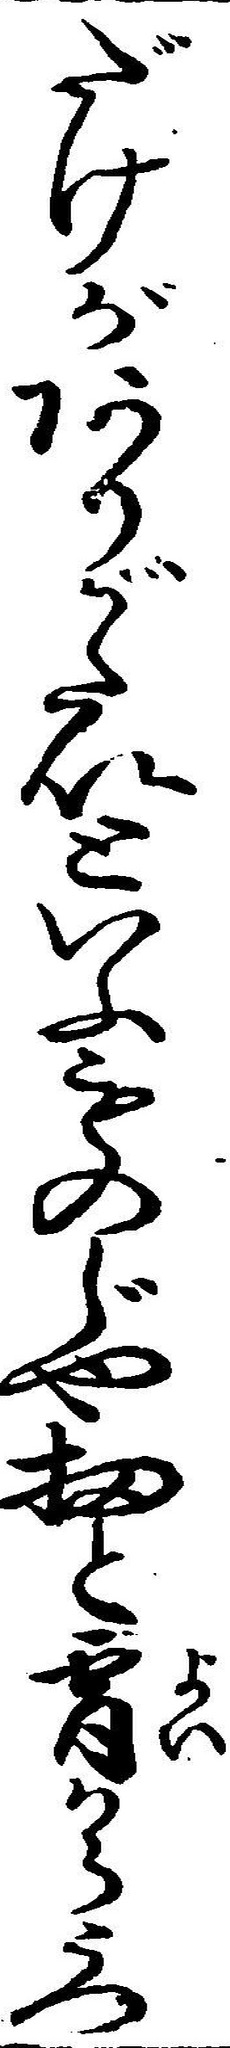だけがありがたいといふものじや扨と宵からうつ
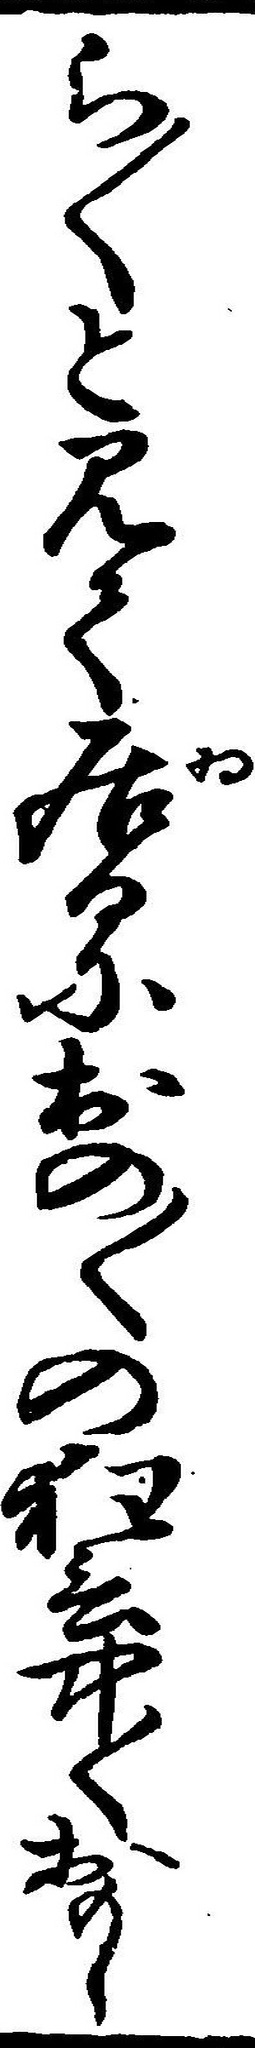ら〳〵見て居るにおの〳〵の狂言中〳〵おもし
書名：草木芝居化物退治 / 泉花堂三蝶(十六兵衛)作
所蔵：東京大学総合図書館 General Library in the University of Tokyo, JAPAN
